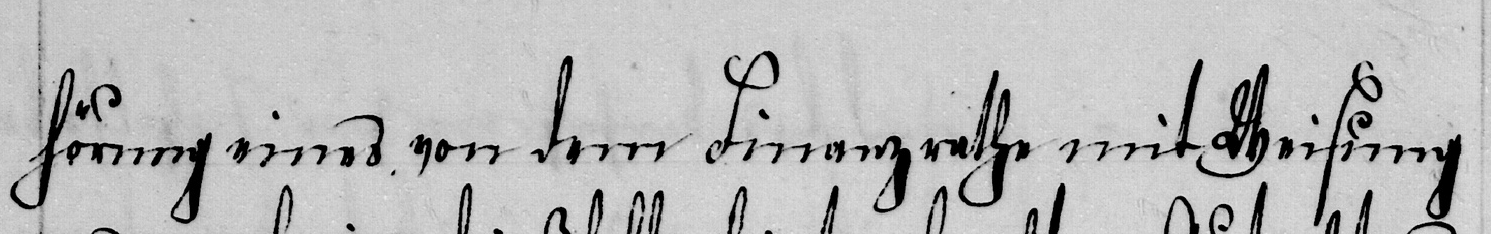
hörung eines von dem Finanzrathe mit Weisung
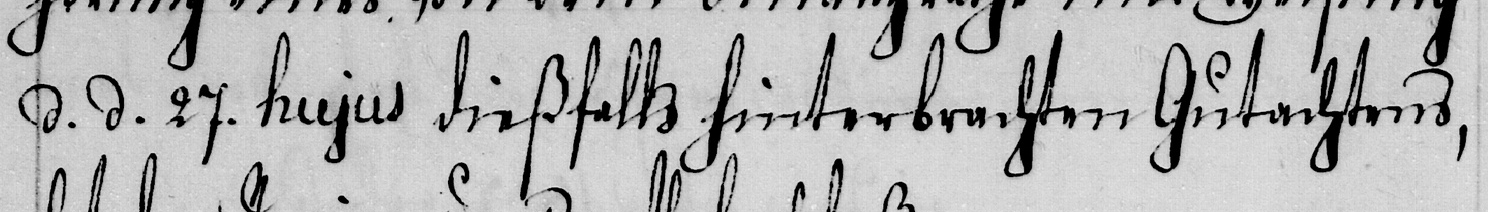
d. d. 27. hujus dießfalls hinterbrachten Gutachtens,
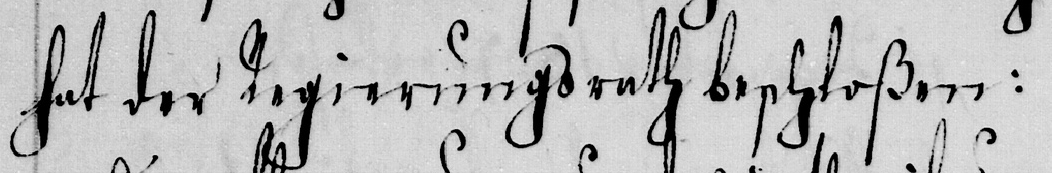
hat der Regierungsrath beschloßen:
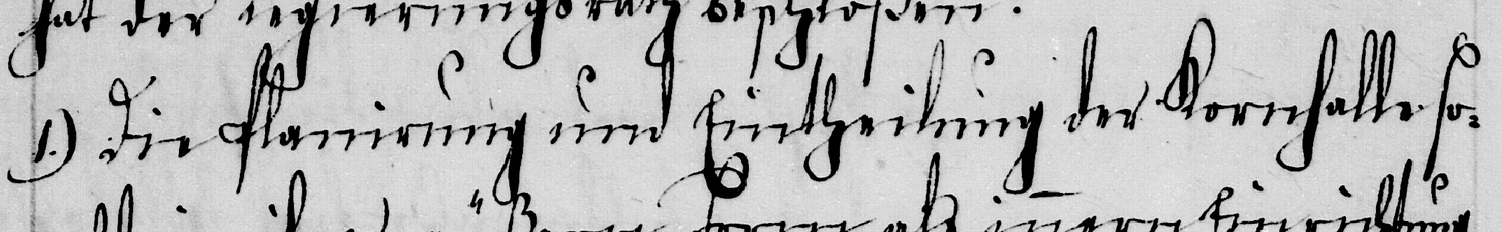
1.) Die Planirung und Eintheilung der Kornhalle s¬
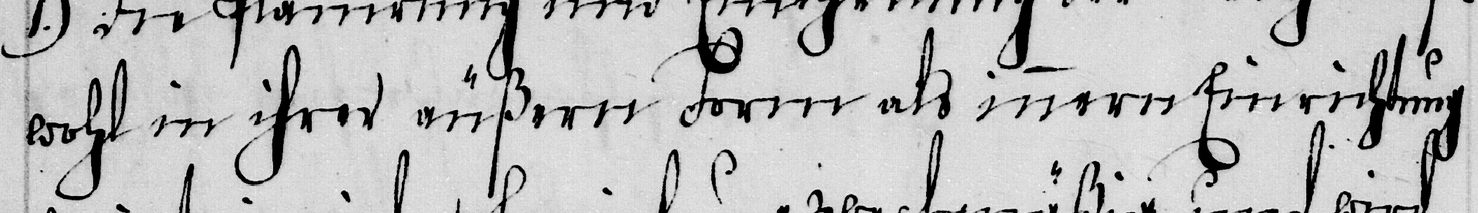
owohl in ihrer äußern Form als innern Einrichtung
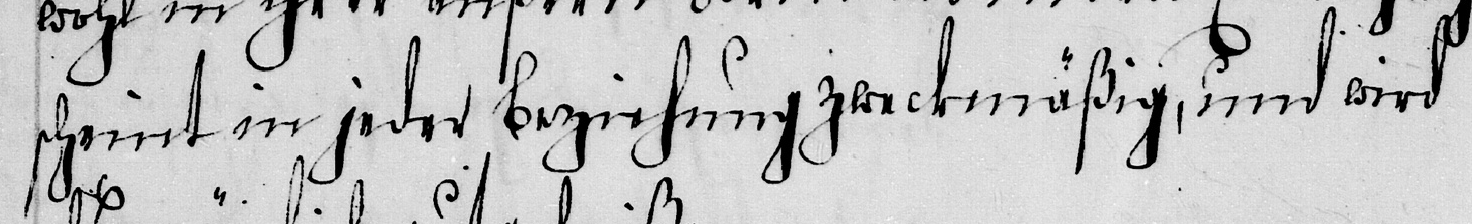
scheint in jeder Beziehung zweckmäßig, und wird
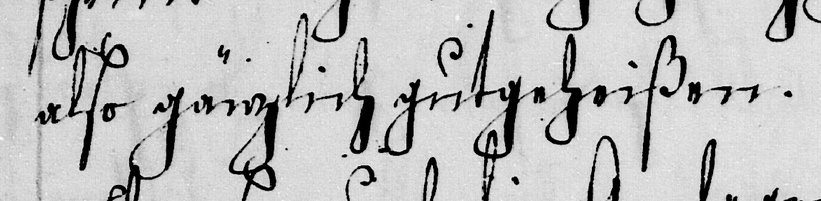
also gänzlich gutgeheißen.
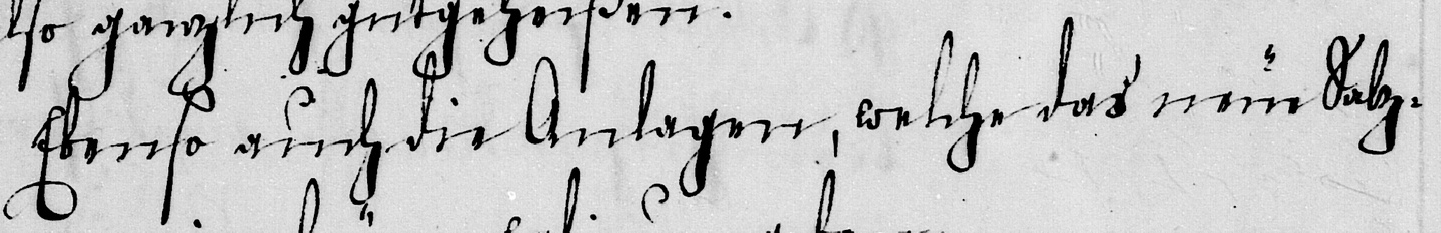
Ebenso auch die Anlagen, welche das neue Salz¬
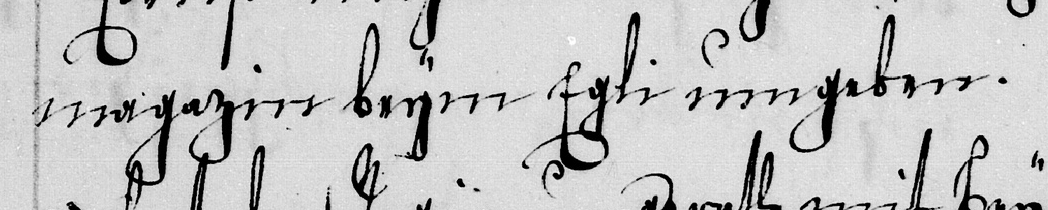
magazin beym Egli umgeben.
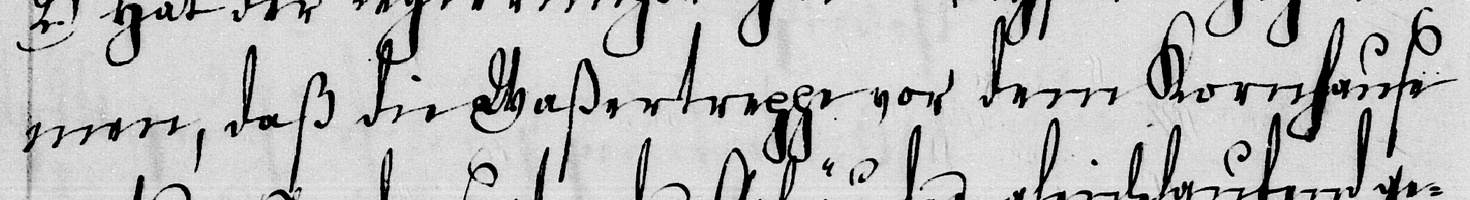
men, daß die Waßertreppe vor dem Kornhause
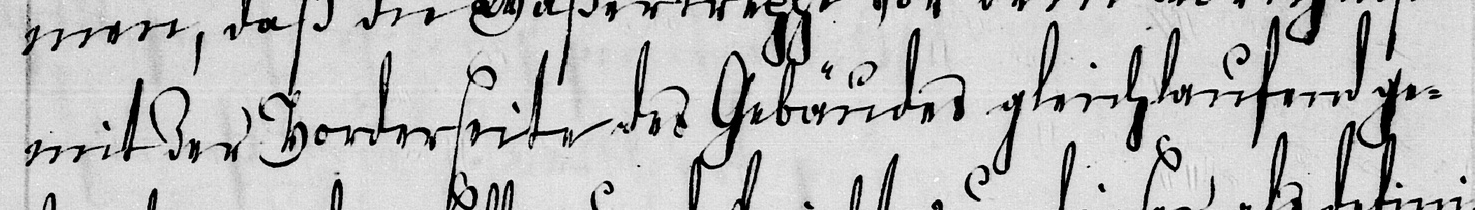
mit der Vorderseite des Gebäudes gleichlaufend ge¬
